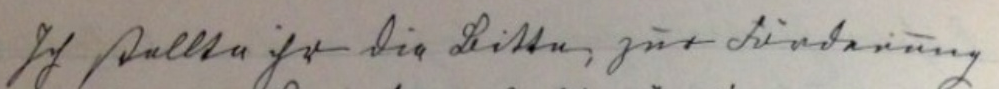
Ich stellte ihr die Bitte zur Förderung
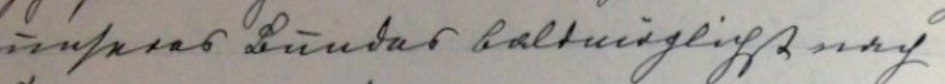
unseres Bundes baldmöglichst nach
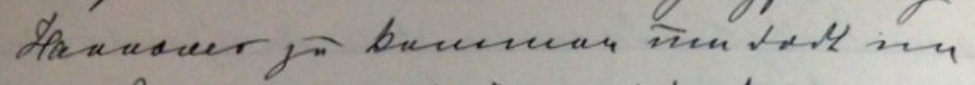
nach Hannover zu kommen um dort im
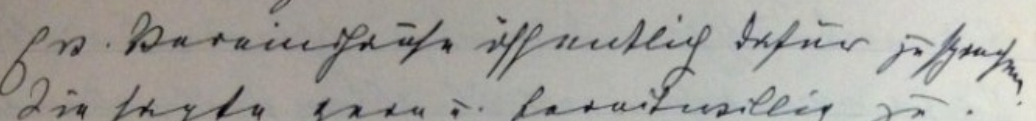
Ev. Vereinshause öffentlich dafür zu sprechen.
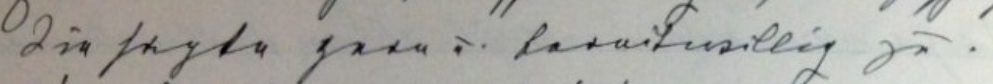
Sie sagte gerne u. bereitwillig zu.
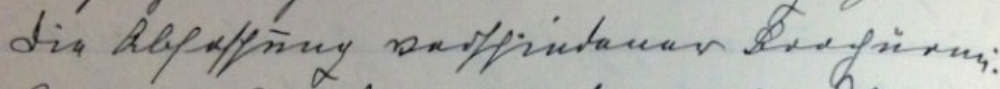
Die Abfassung verschiedener Broschüren:
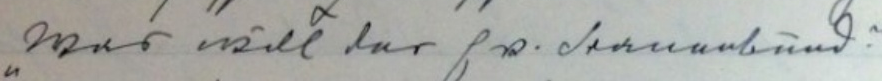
„Was will der Ev. Frauenbund."
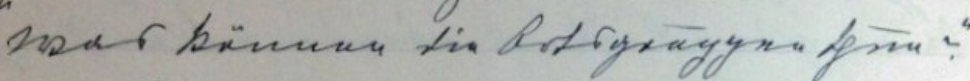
Was können die Ortsgruppen thun
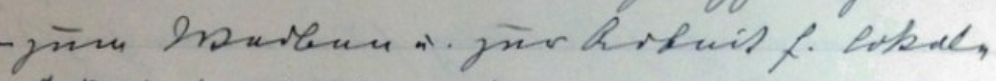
zum Werben u. zur Arbeit f. lokale
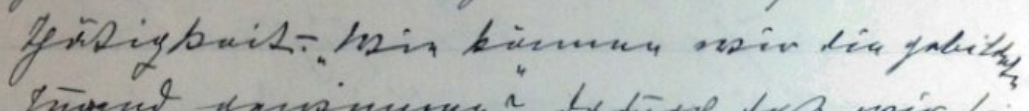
Thätigkeit- Wie können wir die gebildete
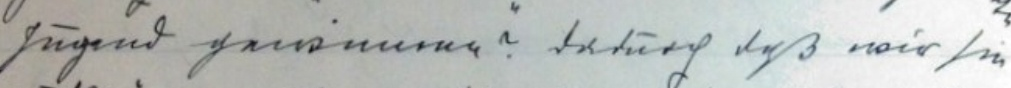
Jugend gewinnen? dadurch daß wir sie
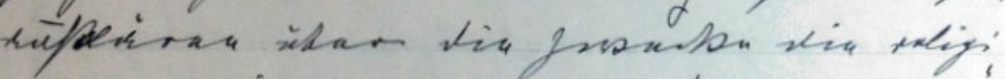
aufklären über die Zwecke die regi
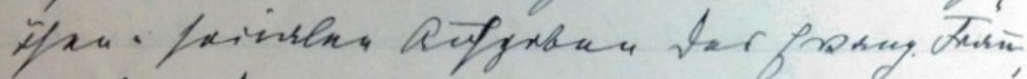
ösen soîialen Aufgaben des Evang. Frau
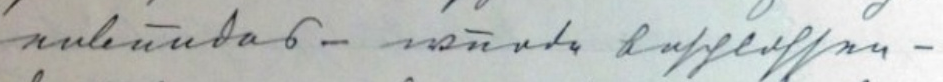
enbundes – wurde beschlossen –
